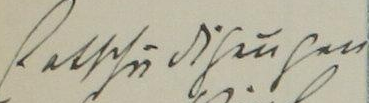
Entschädigungen
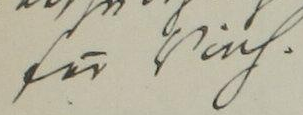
für Vieh
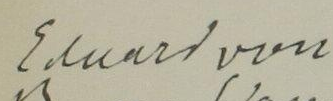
Eduard von
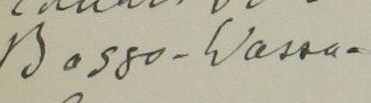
Baggo-Wassa
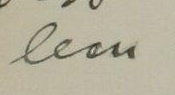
lem
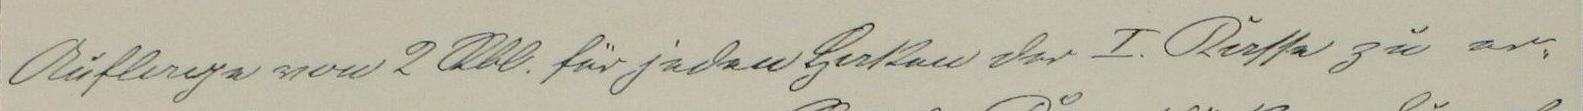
Auflage von 2 Rbl. für jeden Haken der I. Kasse zu er-
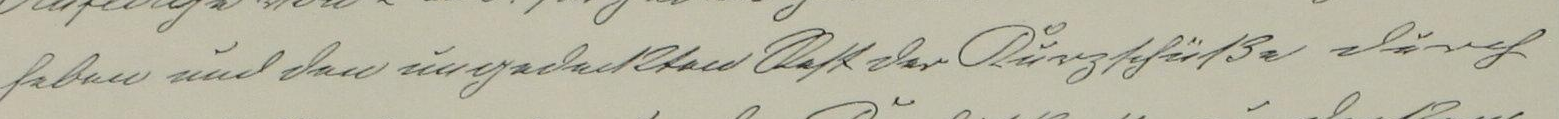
heben und den ungedeckten Rest der Kurzschüße durch
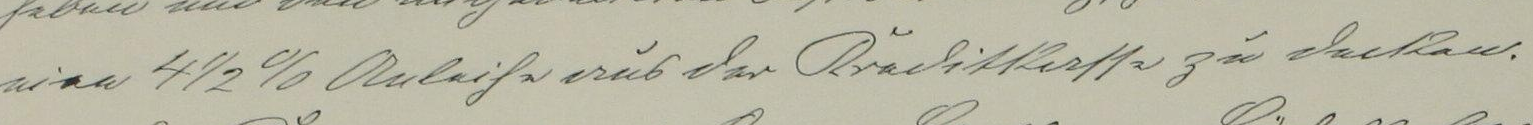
eine 4½ % Anleihe aus der Kreditkasse zu decken.
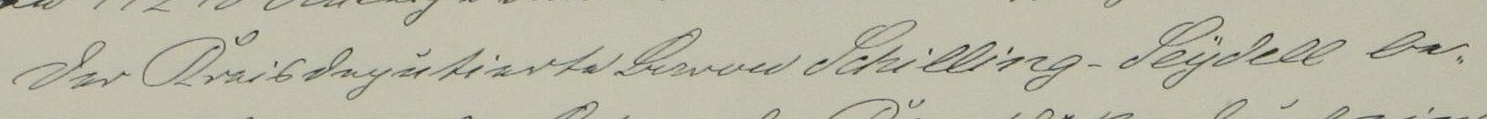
Der Kreisdeputierte Baron Schilling-Seydell be-
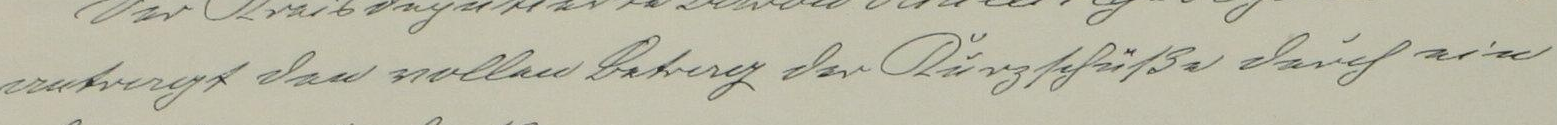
antragt den vollen Betrag der Kurzschüße durch ein
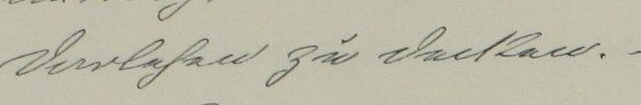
Darlehen zu decken.
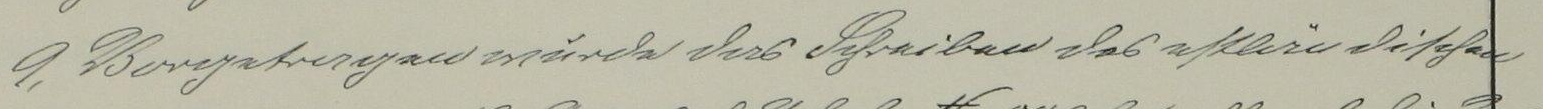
9. Vorgetragen wurde das Schreiben des estländischen
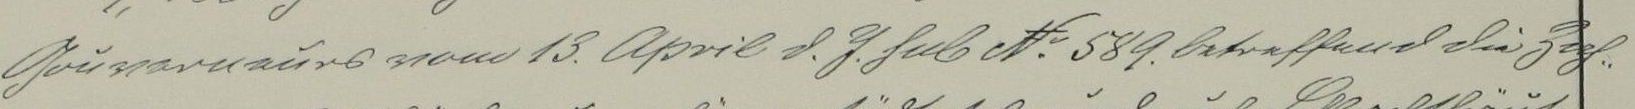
Gouverneurs vom 15. April d.J. sub No. 589. betreffend die Zah-
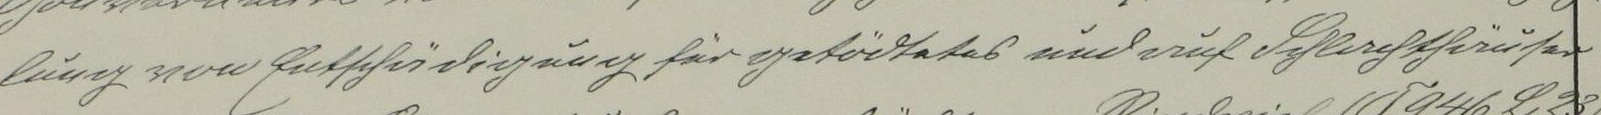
lung von Entschädigung für getödtetes und auf Schlachthäuser
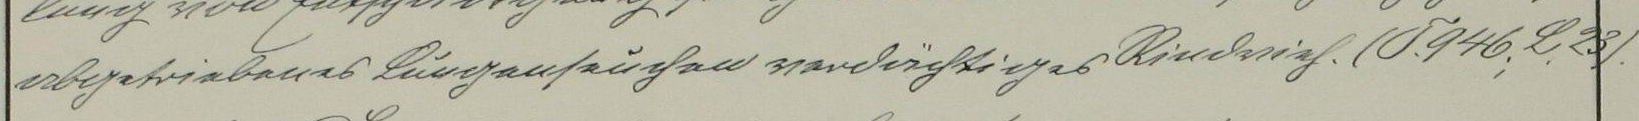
abgetriebenes Lungenseuchen verdächtiges Rindvieh. (T.946; L.23).
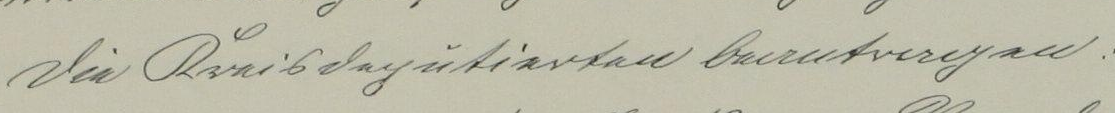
Die Kreisdeputierten beantragen:
